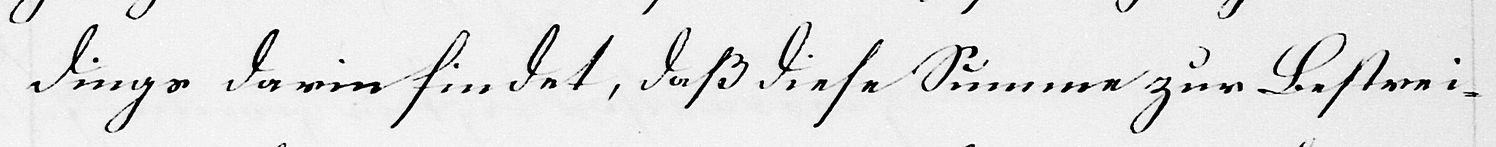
dings darin findet, daß diese Summe zur Bestrei¬
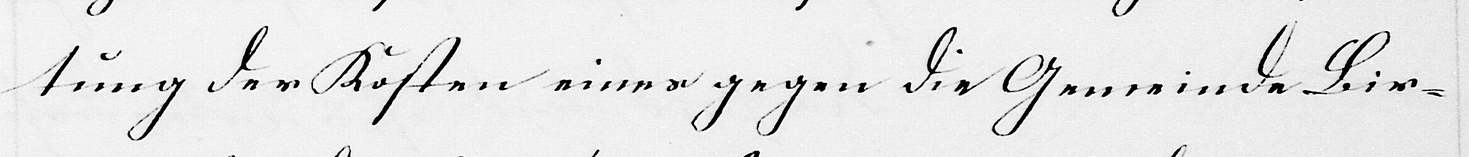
tung der Kosten eines gegen die Gemeinde Bir¬
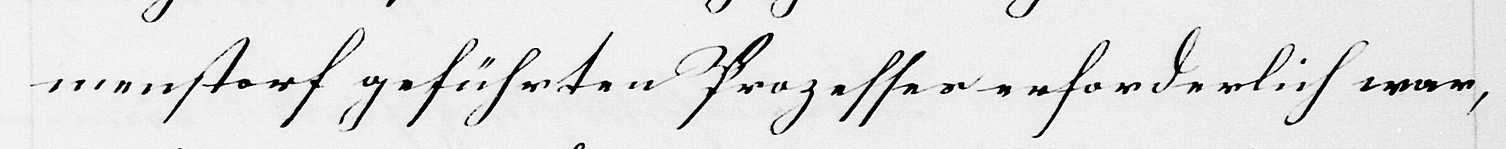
menstorf geführten Prozesses erforderlich war,
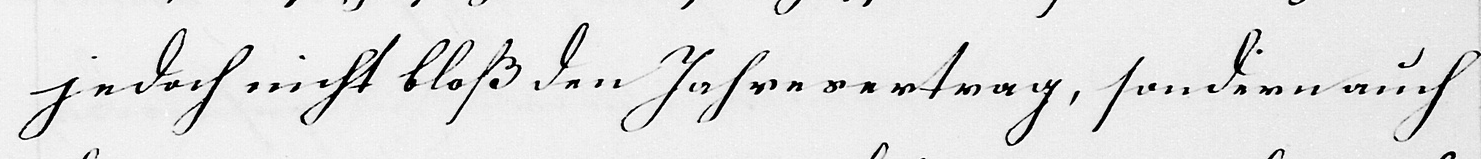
jedoch nicht bloß den Jahresertrag, sondern auch
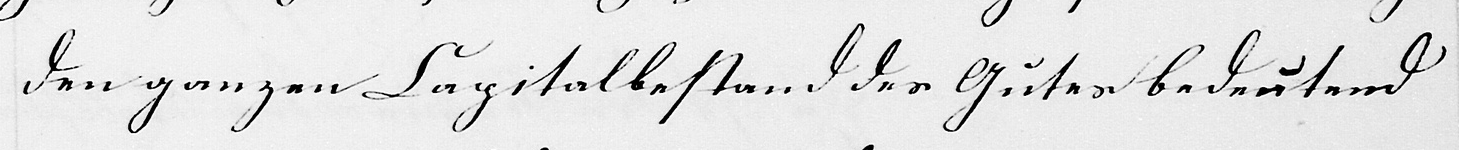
den ganzen Capitalbestand des Gutes bedeutend
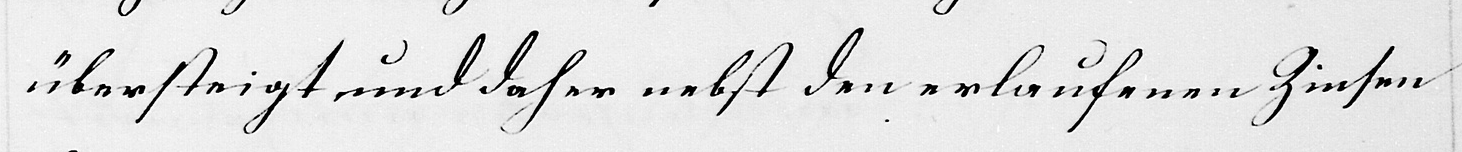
übersteigt und daher nebst den erlaufenen Zinsen
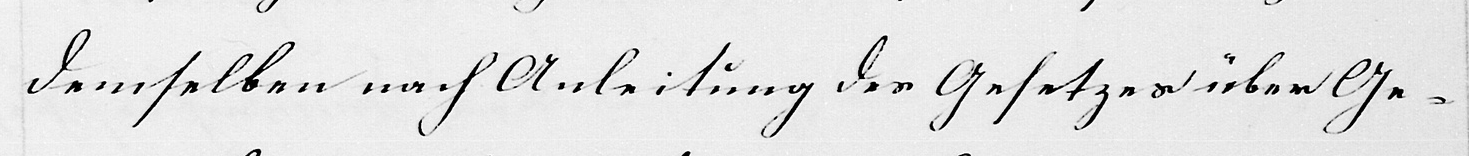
demselben nach Anleitung des Gesetzes über Ge¬
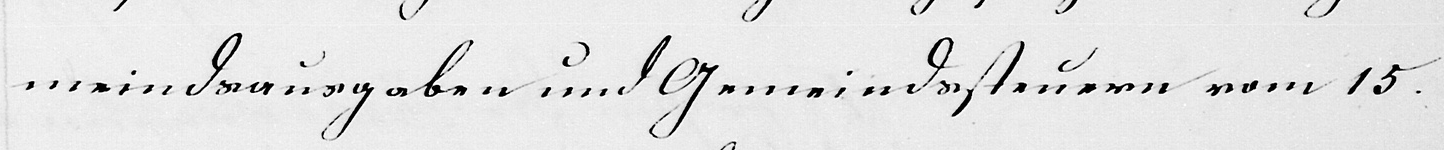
meindsausgaben und Gemeindssteuern vom 15.
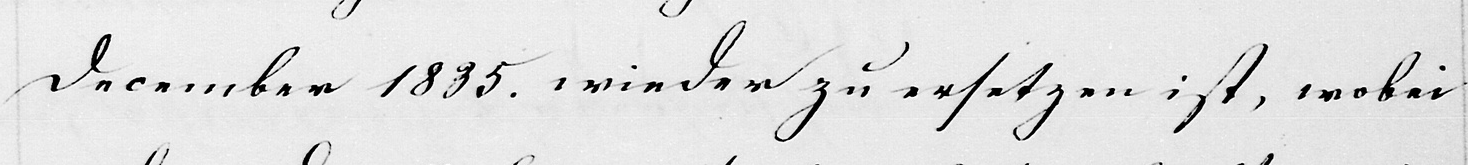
December 1835. wieder zu ersetzen ist, wobei
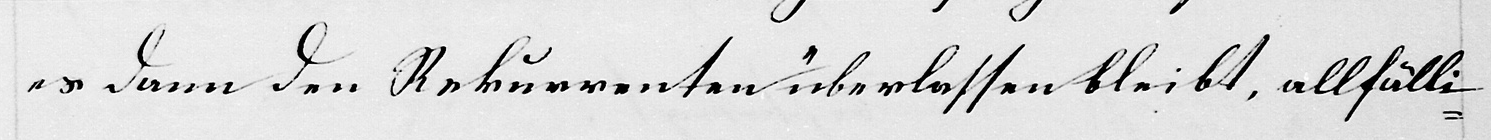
es dann den Rekurrenten überlassen bleibt, allfälli-
